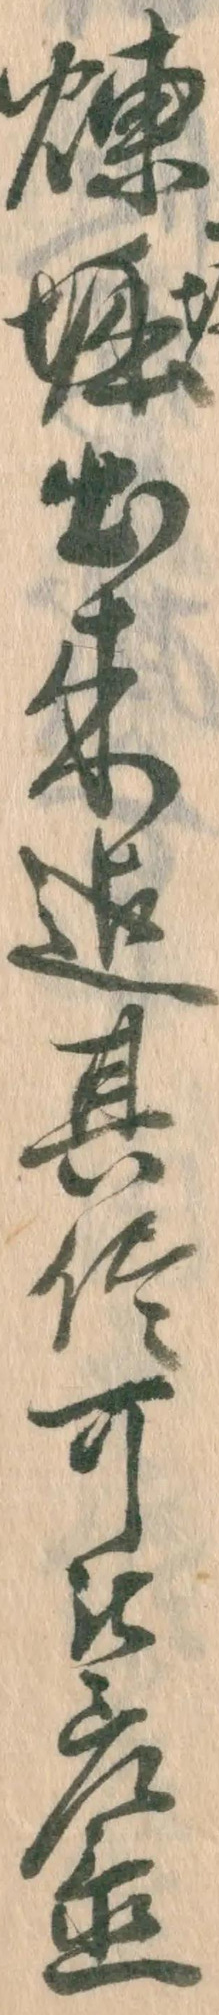煉塀出来迄其儘可被差置
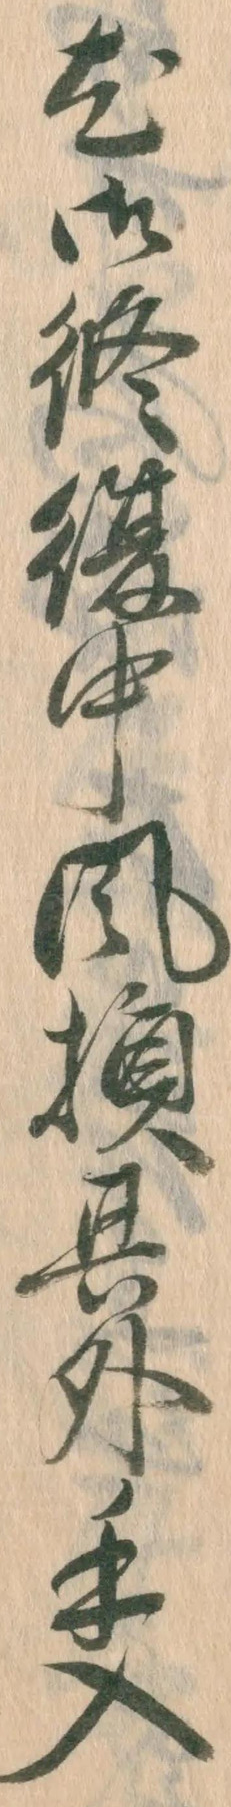尤御修復中風損其外ノ手入
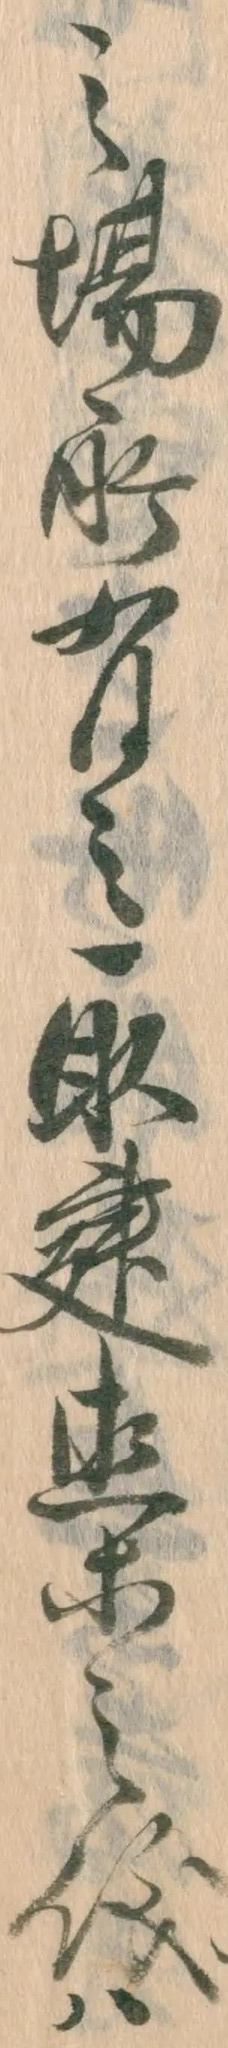之場所有之取建直等之儀ハ
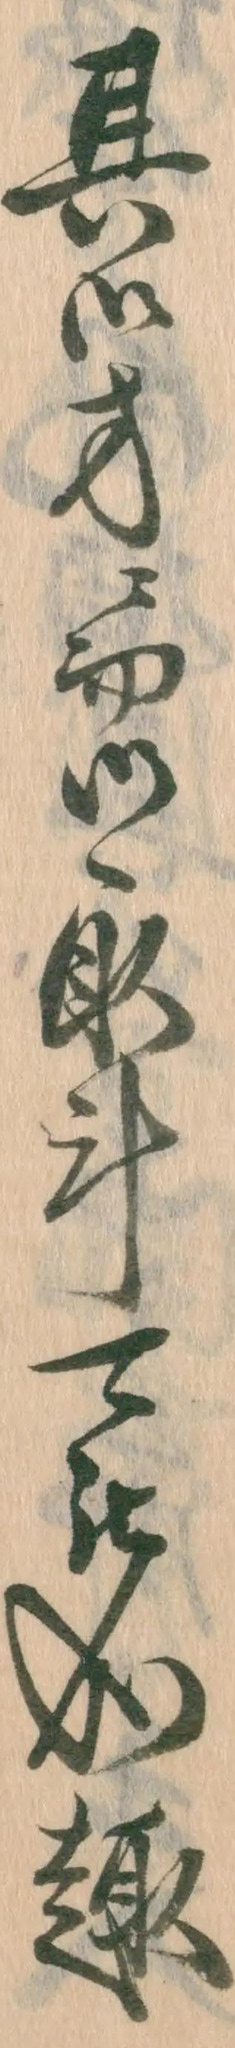其御方ニて御取計可被成趣
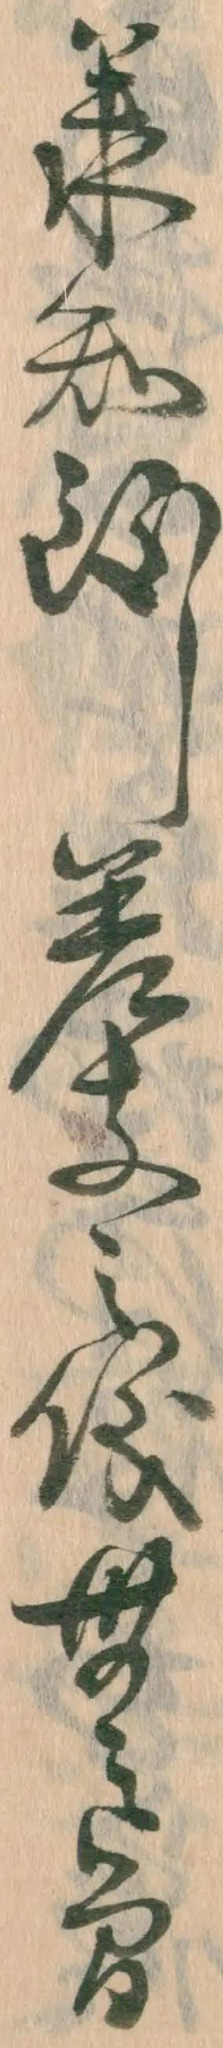承知致し差支之儀無之候間
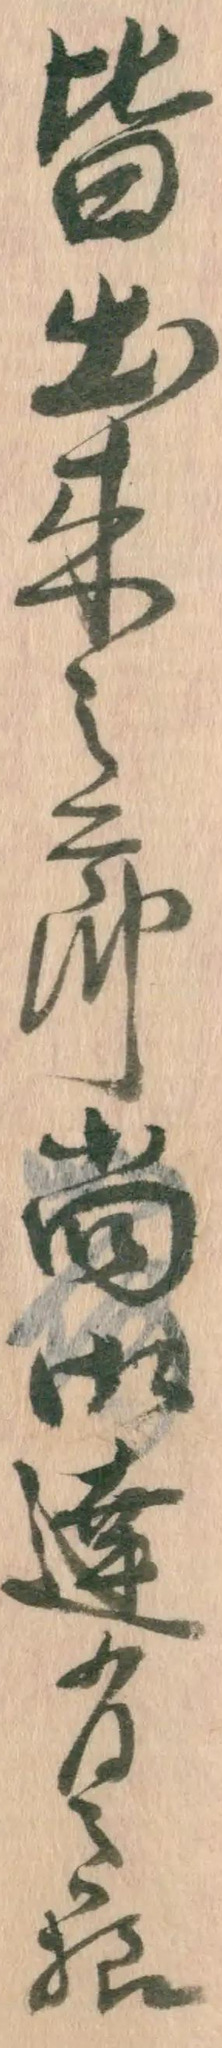皆出来之節尚御達有之候様
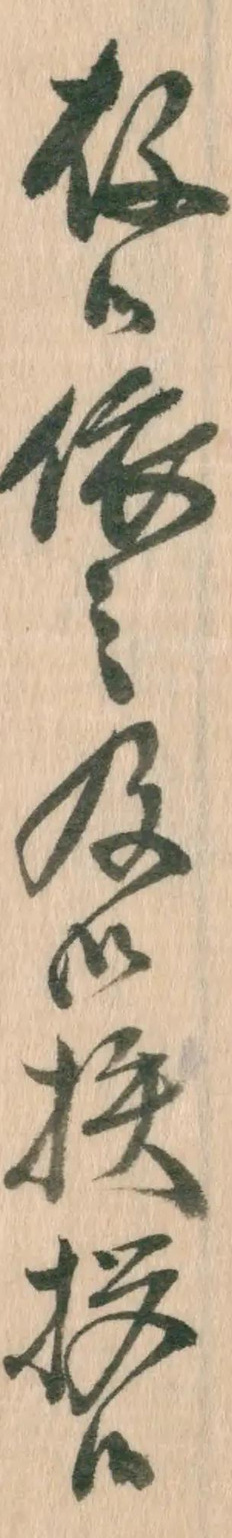存候依之及御挨拶候
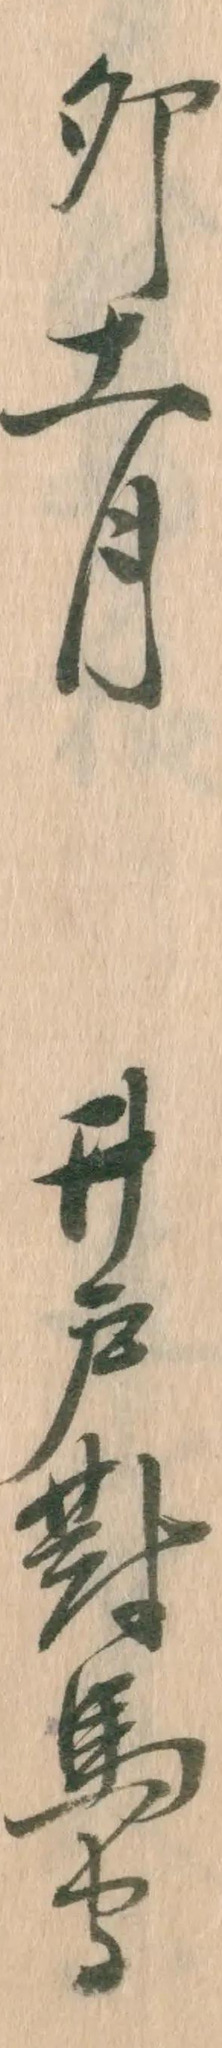卯十一月井戸対馬守

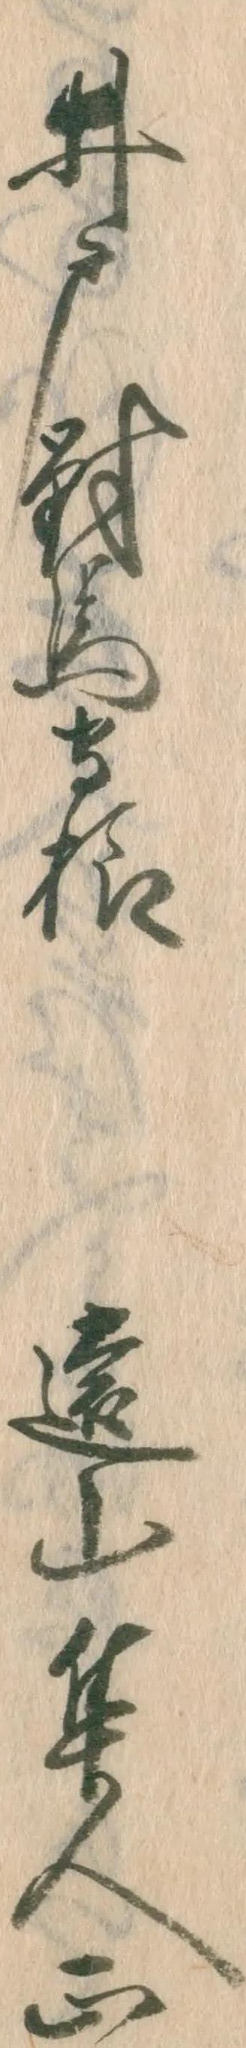│井戸対馬守様遠山隼人正
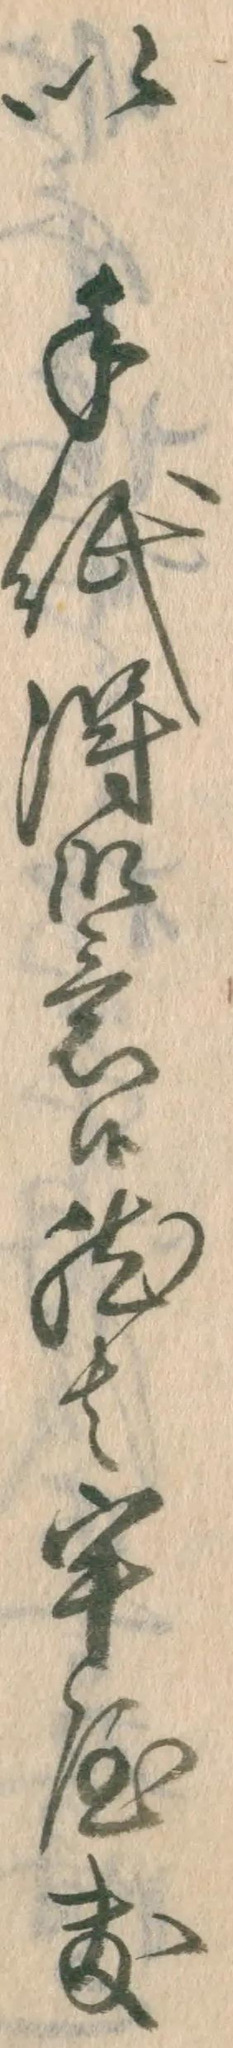以手紙得御意候然は牢屋敷
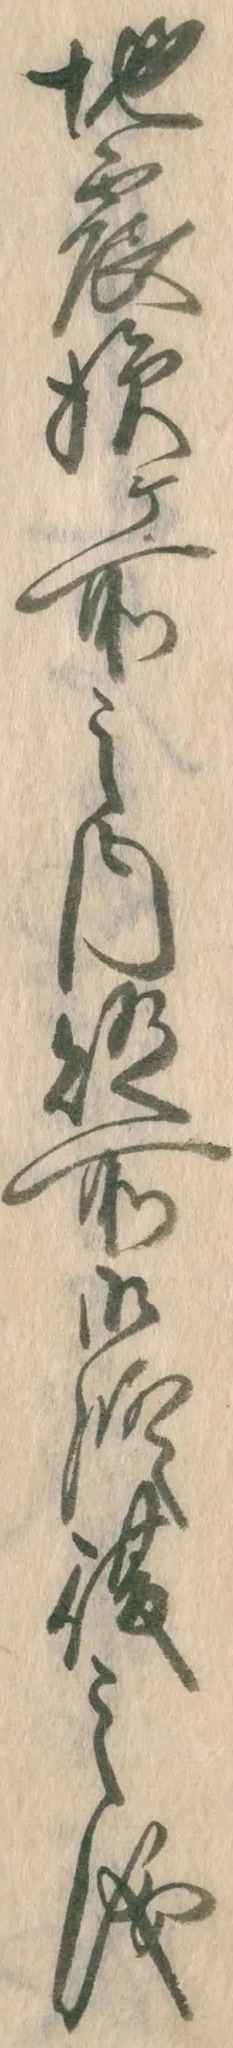地震損ケ所之内賄所御修復之儀

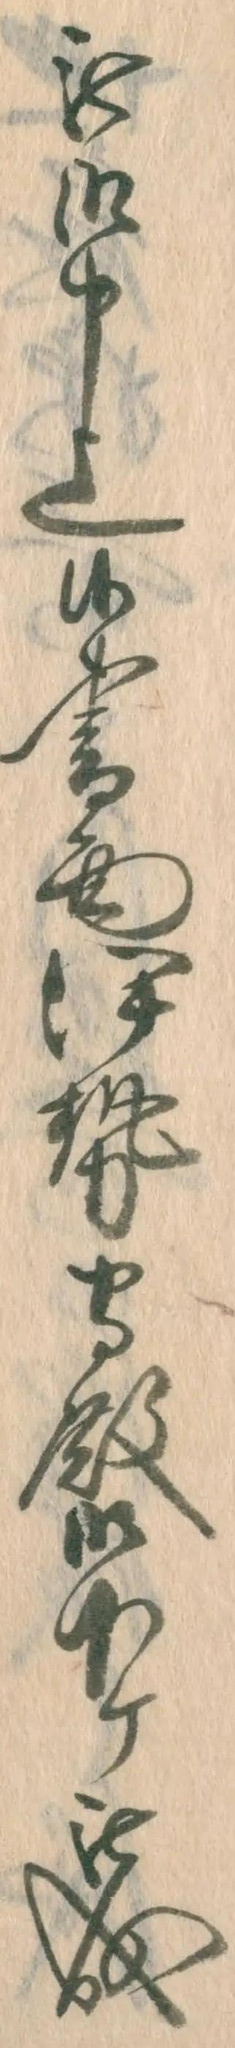被御申上候書面伊勢守殿御下ケ被成
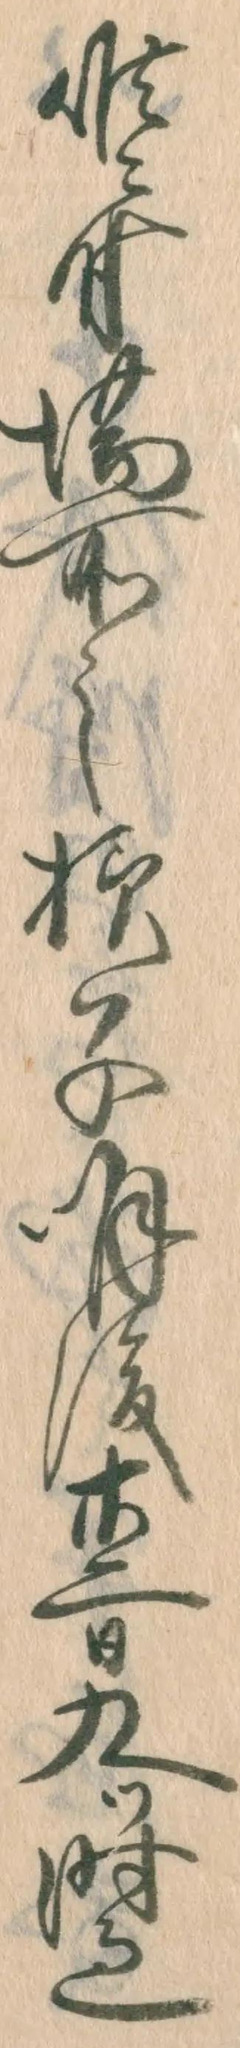候ニ付場所之様子明後廿二日九ツ時過
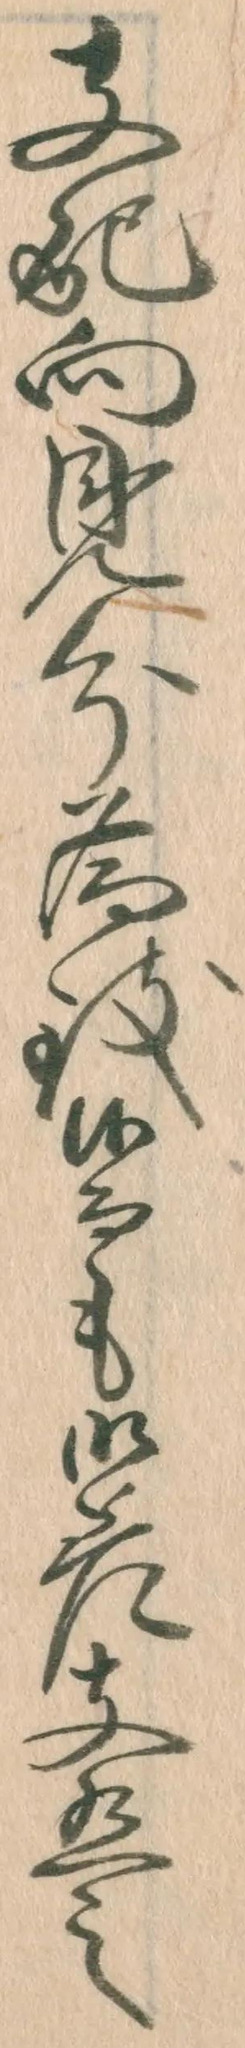支配向見分為致候ても御差支有之
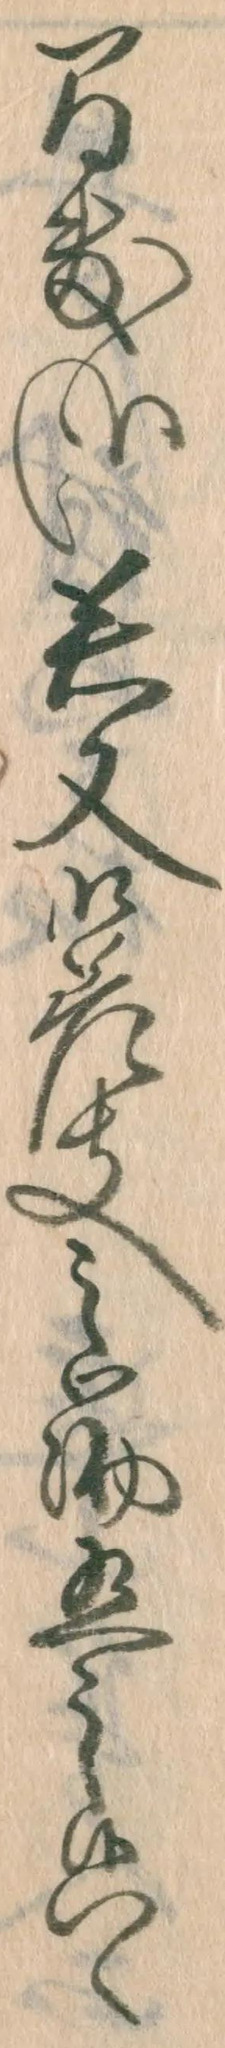間敷哉若又御差支之筋有之候ハヽ
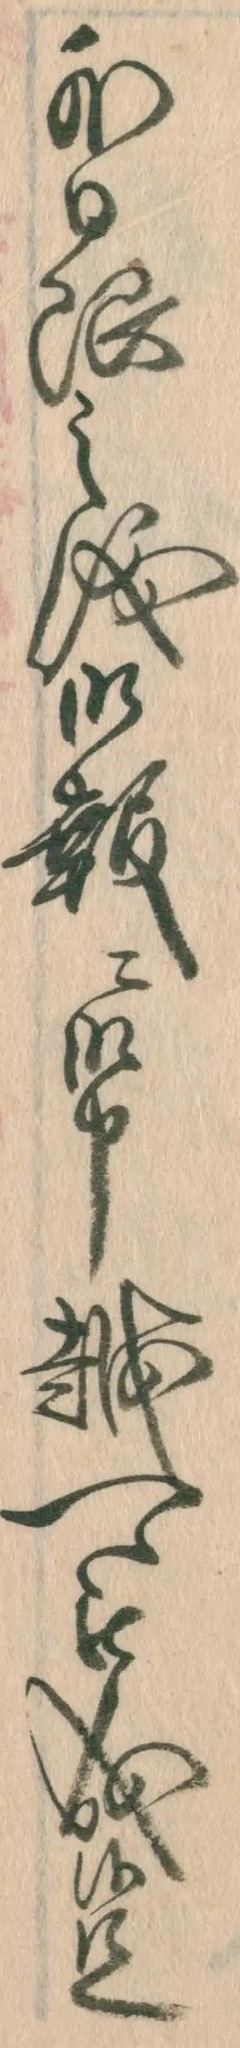外日限之儀御報ニ御申越可被成候且
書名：七十冊物類集 71巻. [44] 四十三 牢屋敷御普請御修覆地震ニ付骨折候牢屋掛御褒美之部
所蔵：国立国会図書館 National Diet Library, JAPAN
